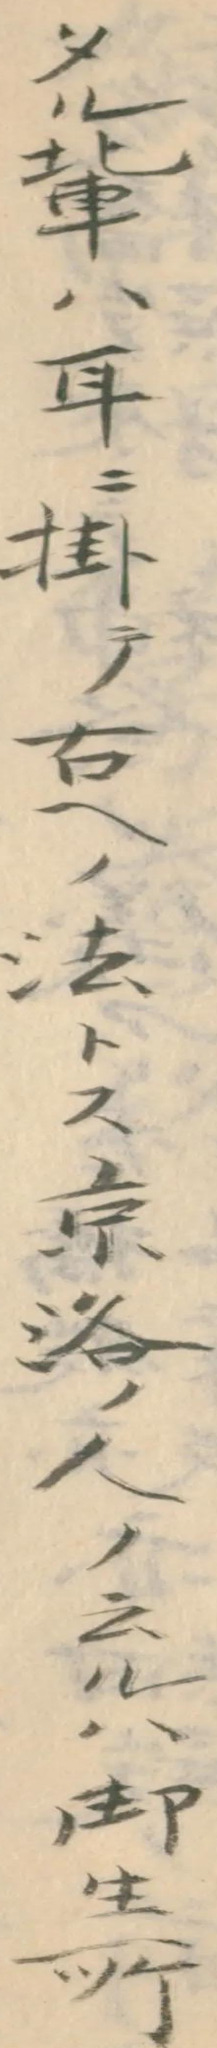タル輩ハ耳ニ掛テ古ヘノ法トス京洛ノ人ノ云ルハ御生所
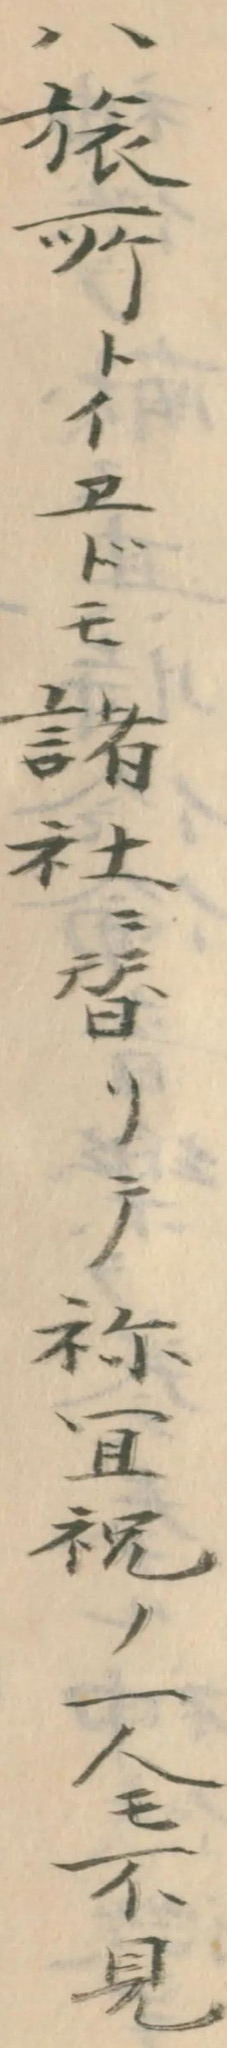ハ旅所トイエドモ諸社ニ替リテ称宜祝ノ一人モ不見
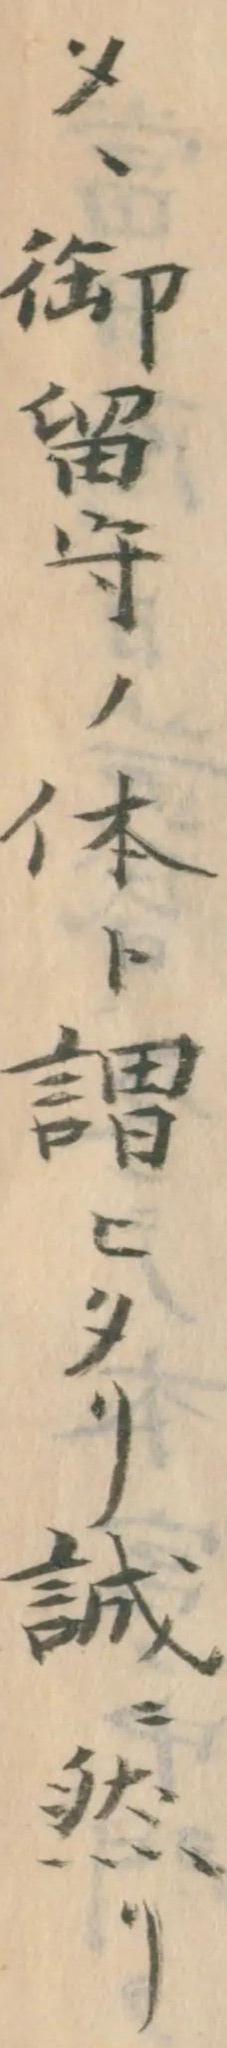タゝ御留守ノ体ト謂ヒタリ誠ニ然リ

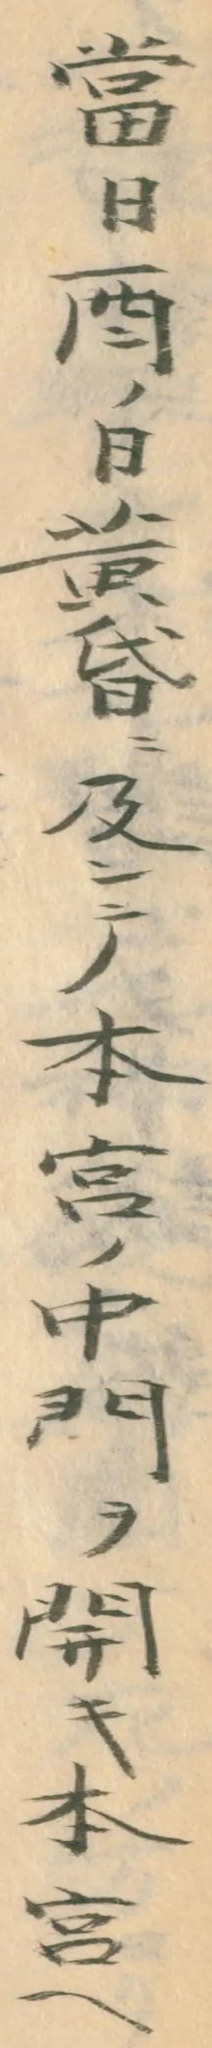當日酉ノ日黄昏ニ及ンテ本宮ノ中門ヲ開キ本宮ヘ
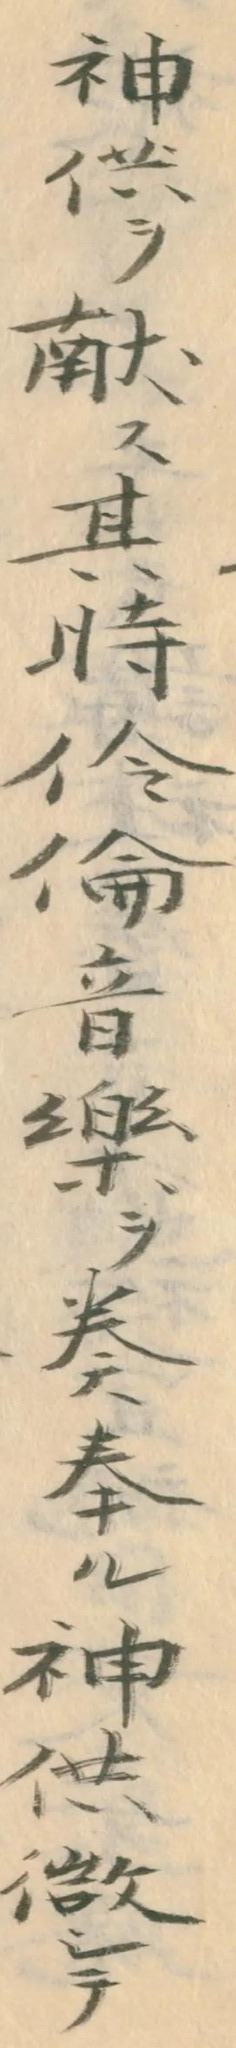神供ヲ献ス其時怜倫音楽ヲ奏奉ル神供徵シテ
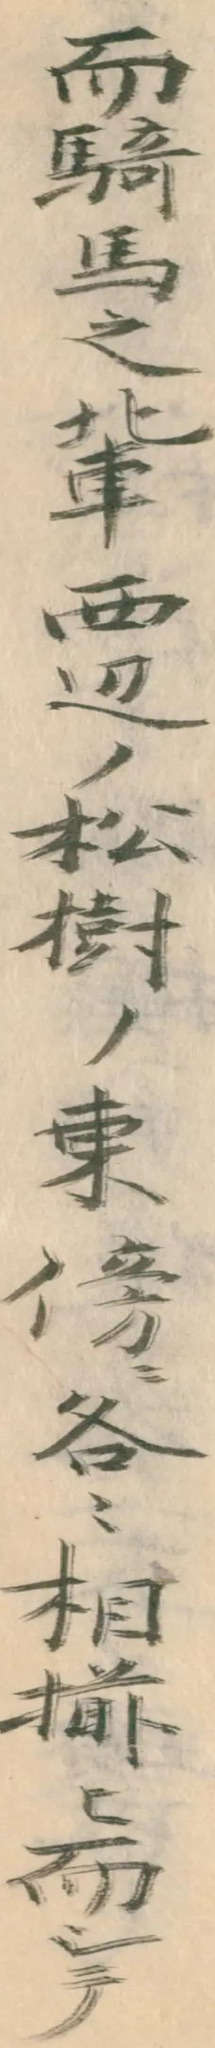而騎馬之輩西辺ノ松樹ノ東傍ニ各々相揃ヒ而シテ
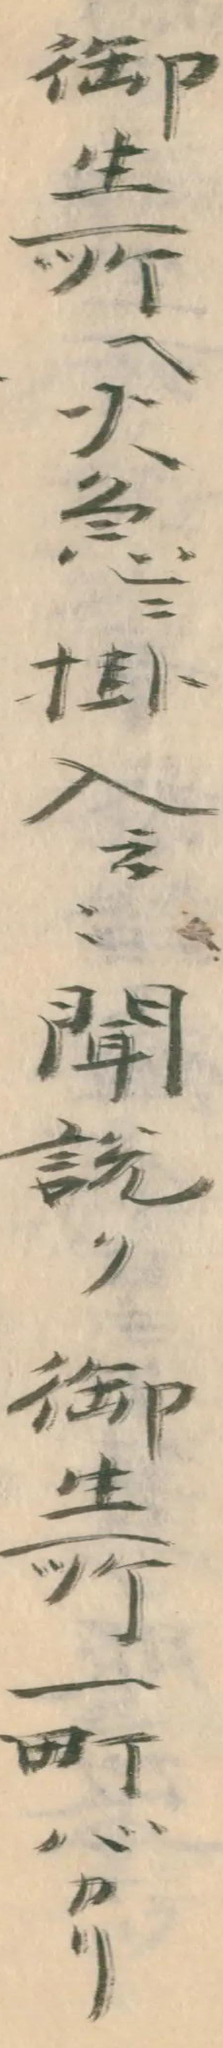御生所へ火急ニ掛入云々聞説ク御生所一町バカリ
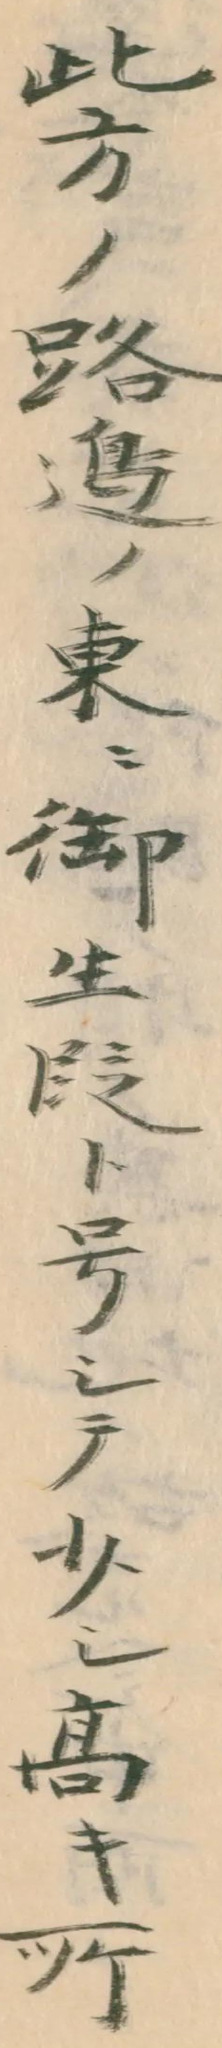此方ノ路辺ノ東ニ御生段ト号シテ少シ高キ所
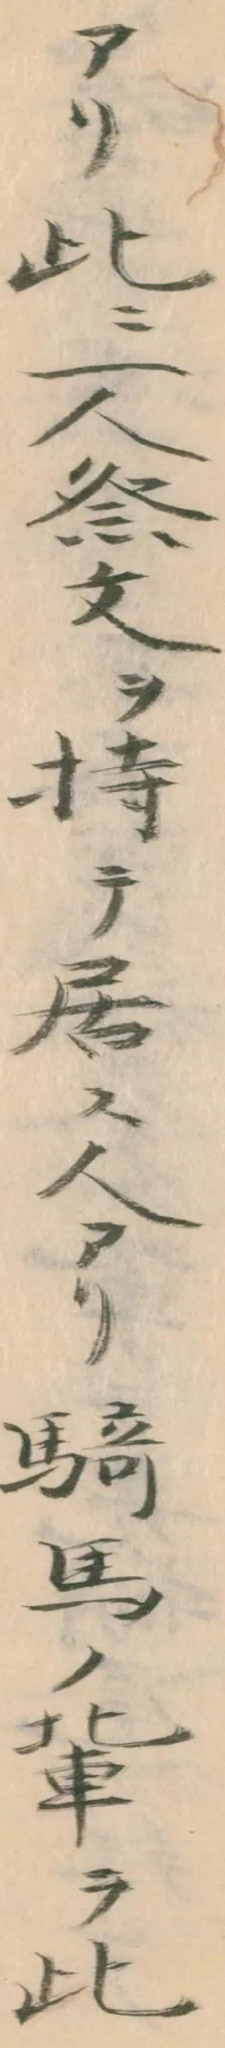アリ此ニ一人祭文ヲ持テ居ス人アリ騎馬ノ輩ヲ此
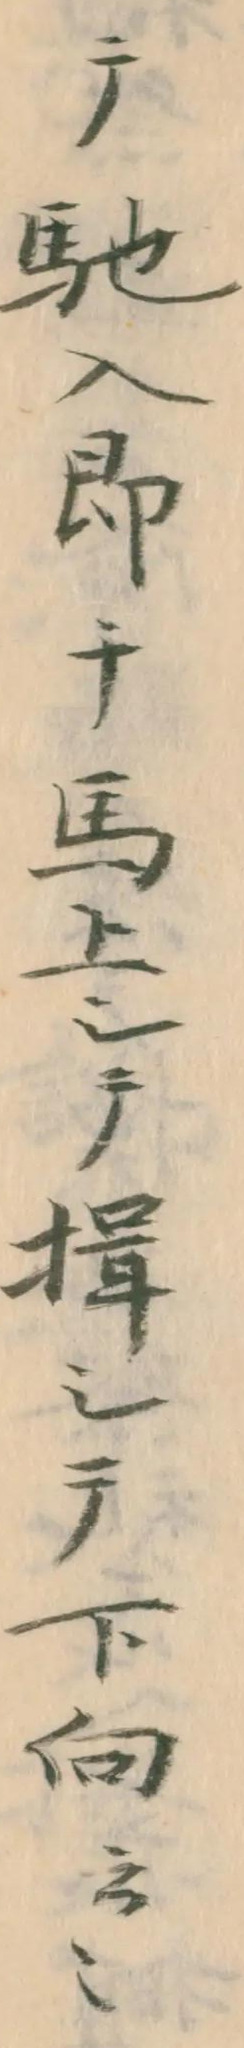テ馳入即チ馬上シテ捍シテ下向云々
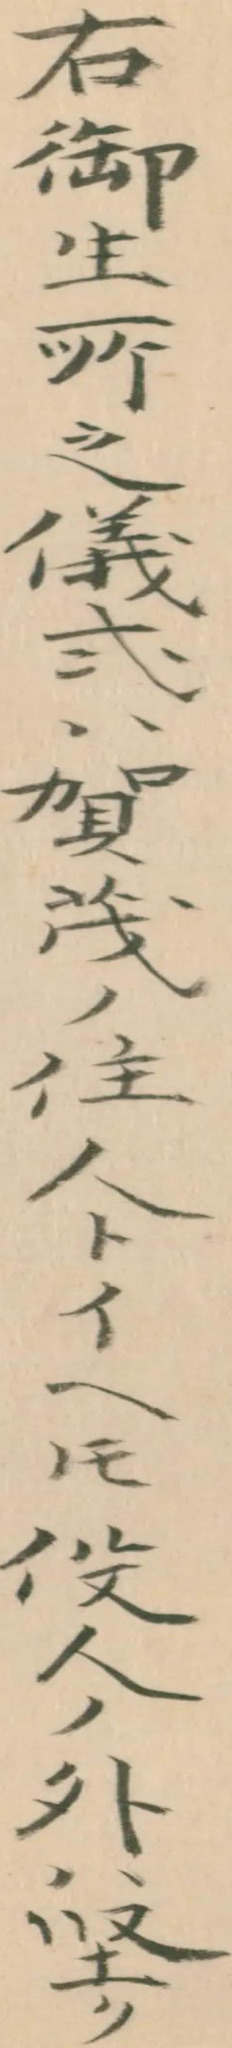右御生所之儀式ハ賀茂ノ住人トイヘトモ役人ノ外ハ堅ク
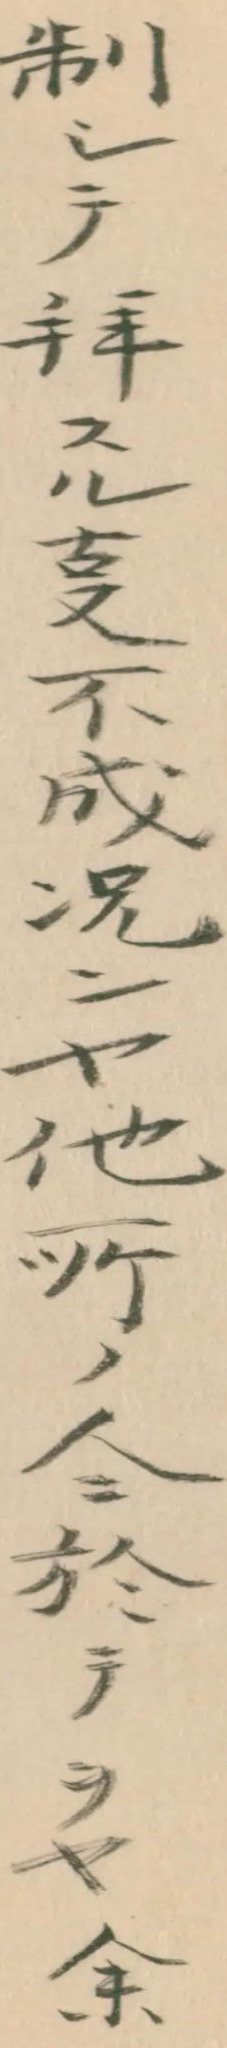制シテ拝スル事不成況ンヤ他所ノ人ニ於テヲヤ余
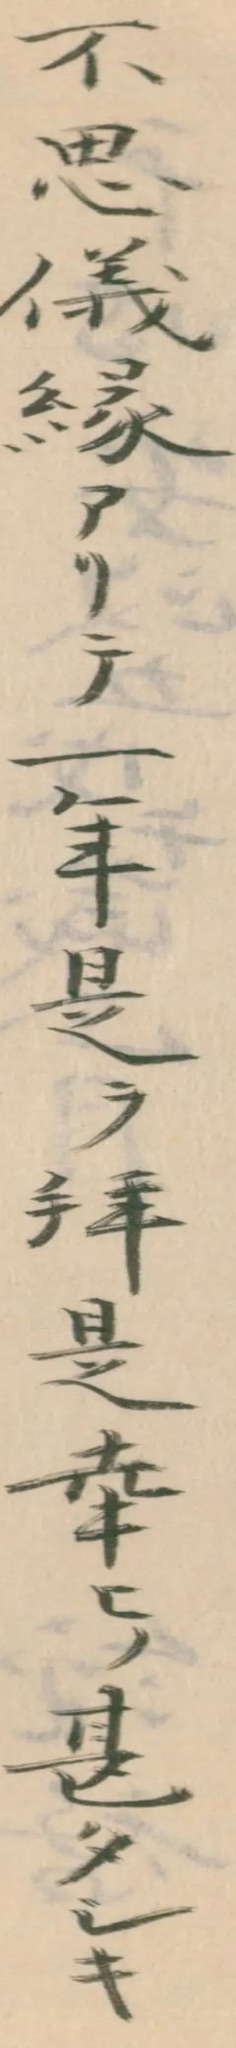不思議縁アリテ一年是ヲ拝是幸ヒノ甚タシキ
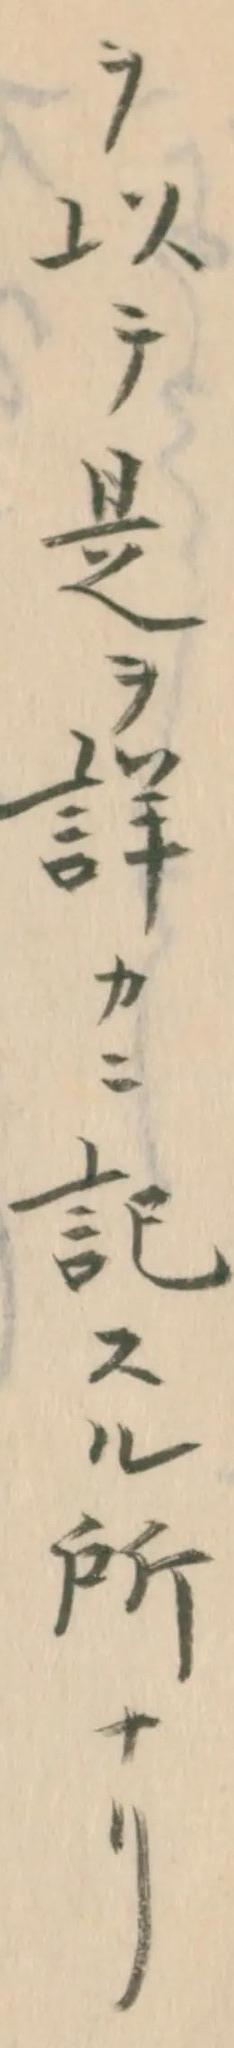ヲ以テ是ヲ詳カニ記スル所ナリ
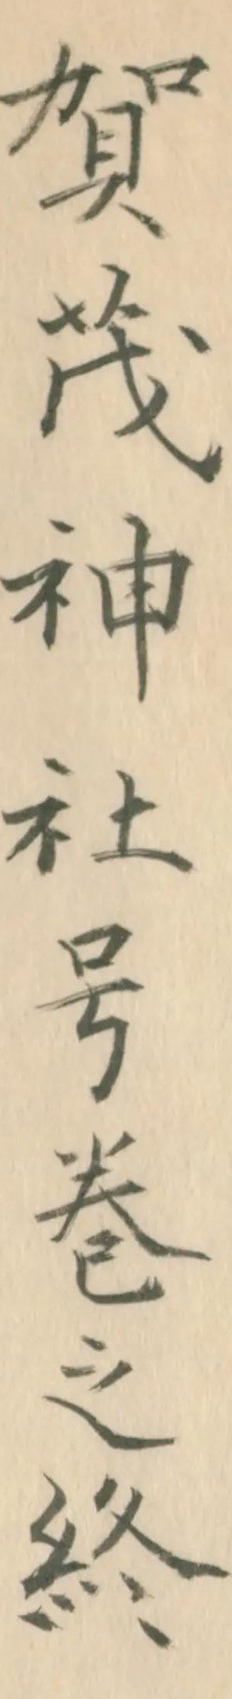賀茂神社号巻之終

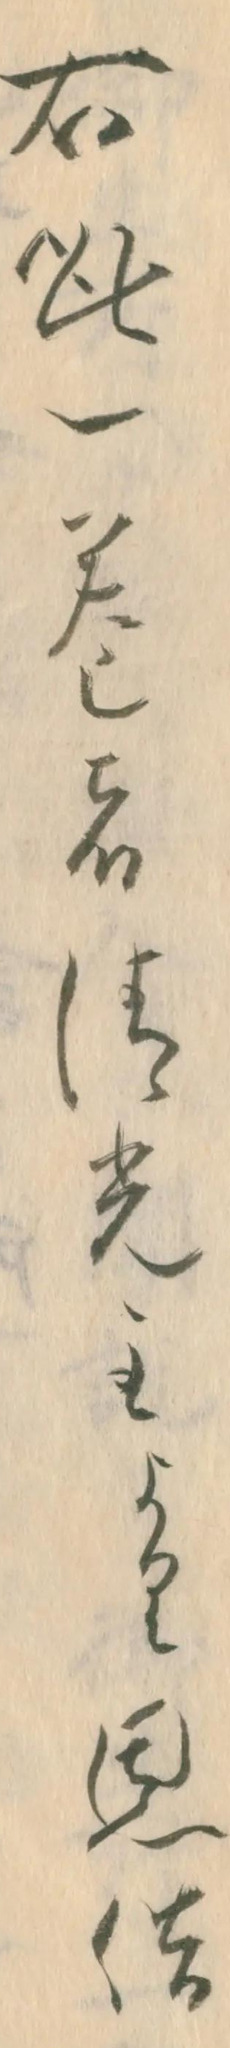右此一巻者清光主より恩借
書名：賀茂社記録. 第91冊
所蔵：国立国会図書館 National Diet Library, JAPAN
